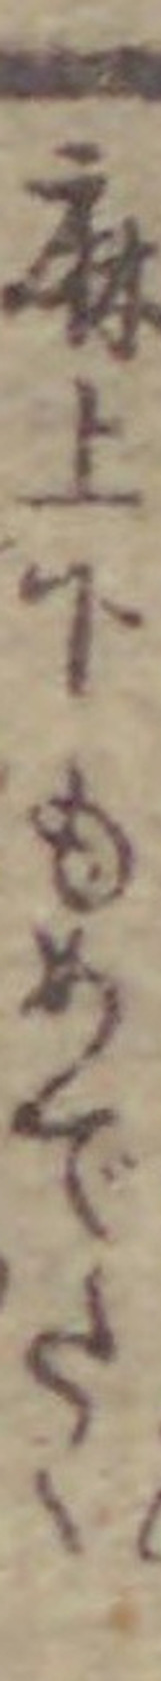麻上下もめでたく
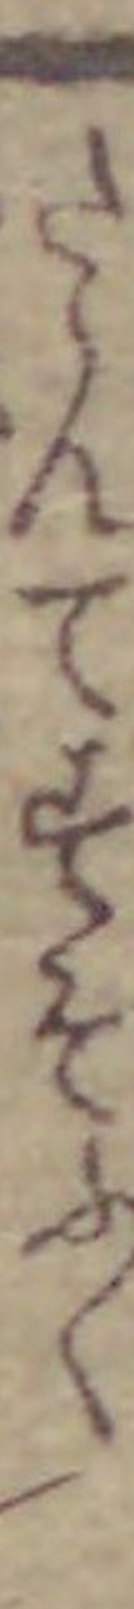た〻んてすそふく
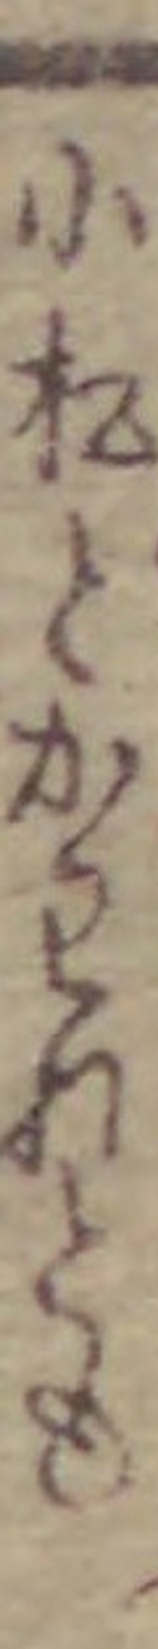小松とかわれとも
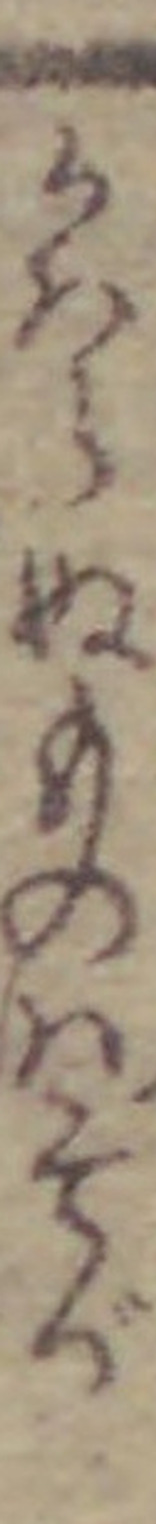かはらぬものはそが
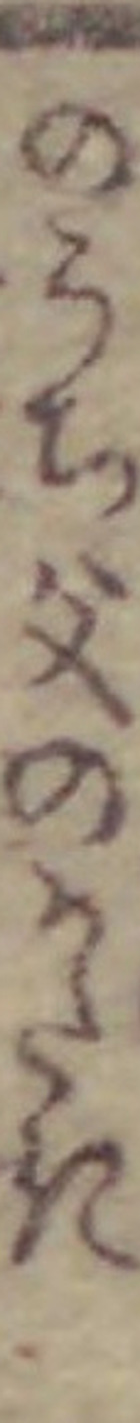のうち父のかたき
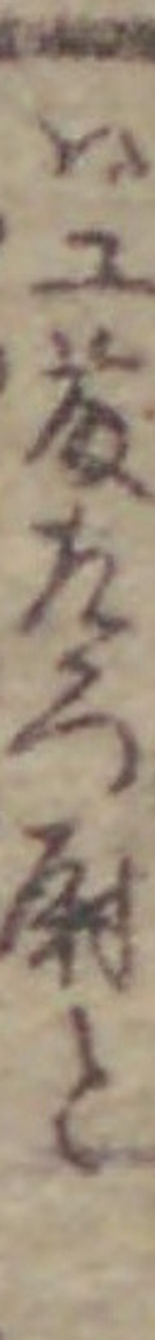は工藤左衛門尉と
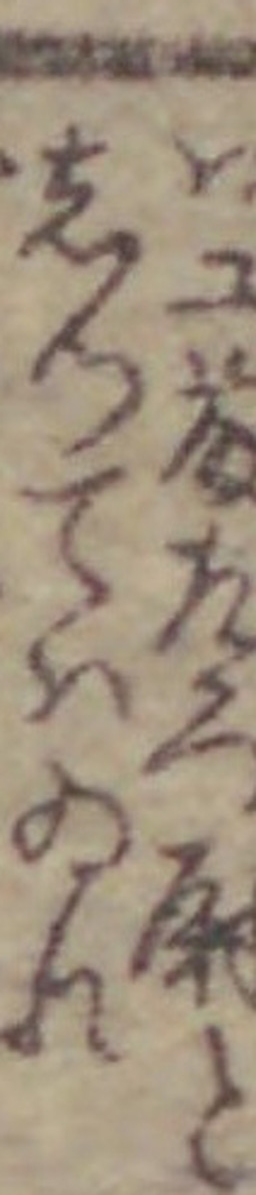しつてはゐれ
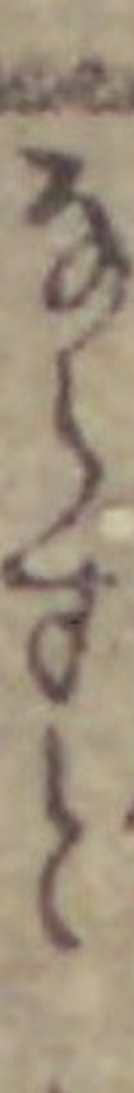ならすと
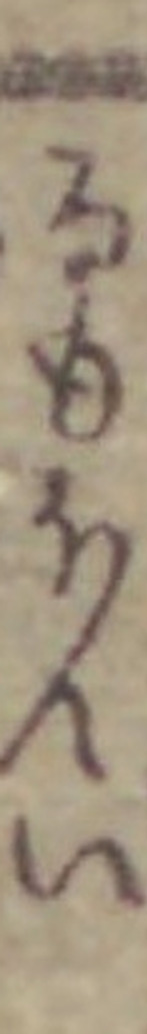るもほんい
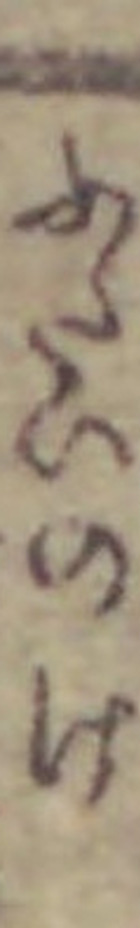ふたいのけ
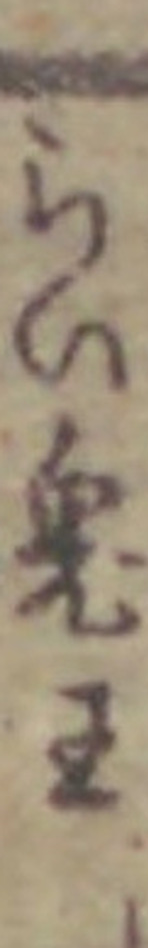らい鬼王
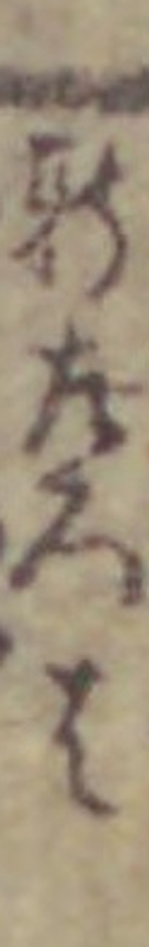新左衛門は
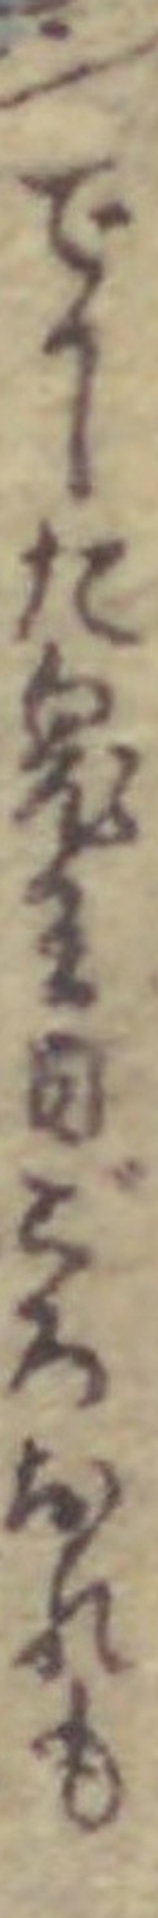でかした鬼王日ごろおれも
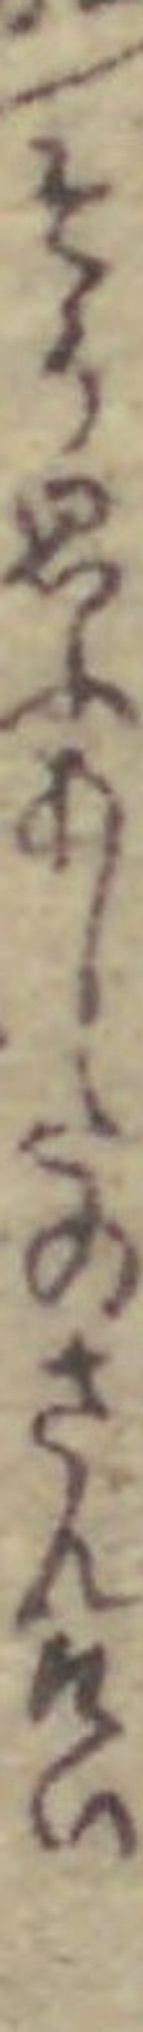そう思ふあしたのさんけい
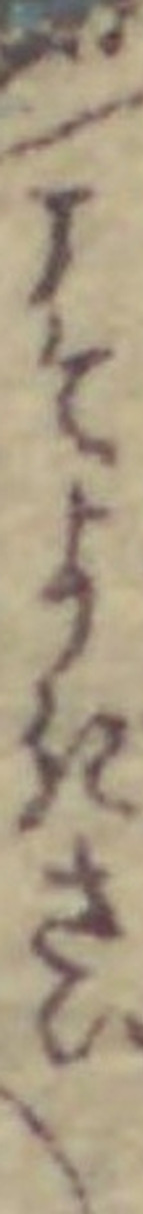こそよきさい
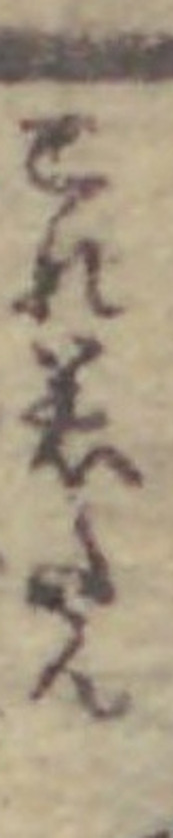これ若たん
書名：間似合嘘言曽我 3巻
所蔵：国立国会図書館 National Diet Library, JAPAN
